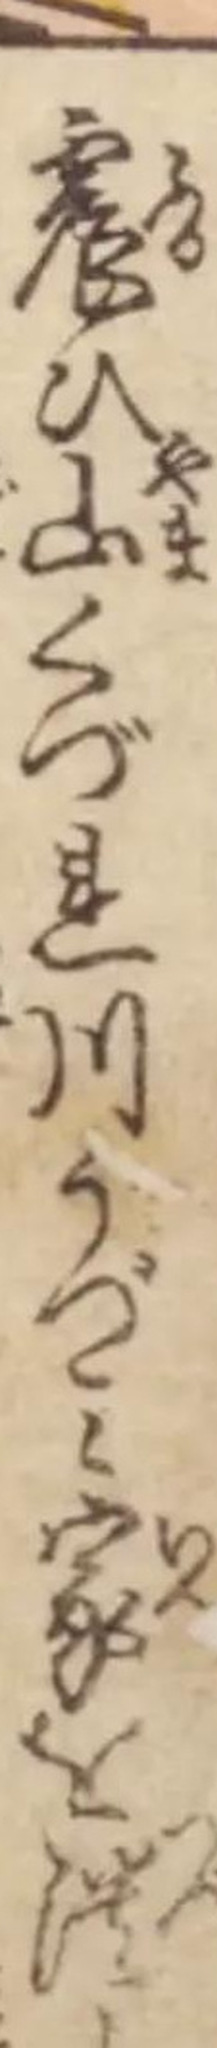震ひ山くづれ川うづみ家を潰し府を
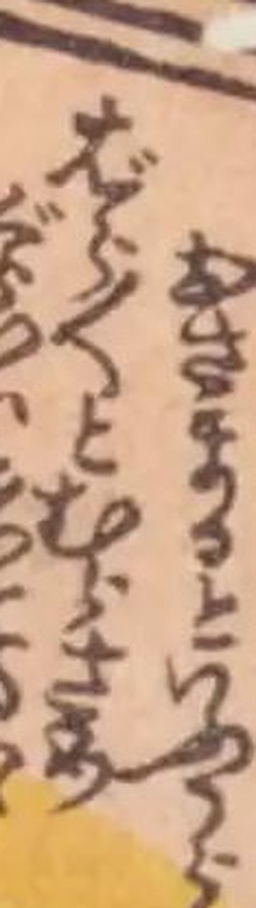ばら〳〵とむらさめ
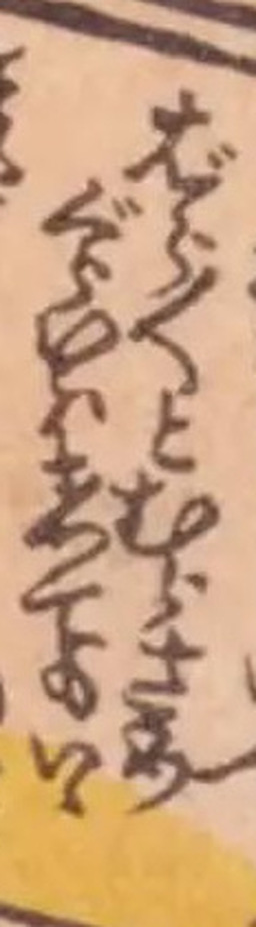ぐらいはしてもいゝ
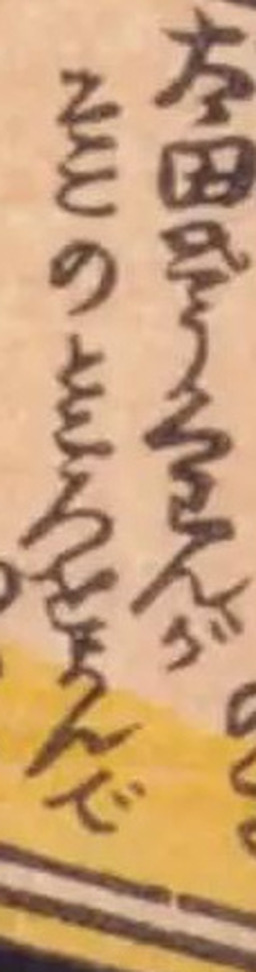そこのところをよんで
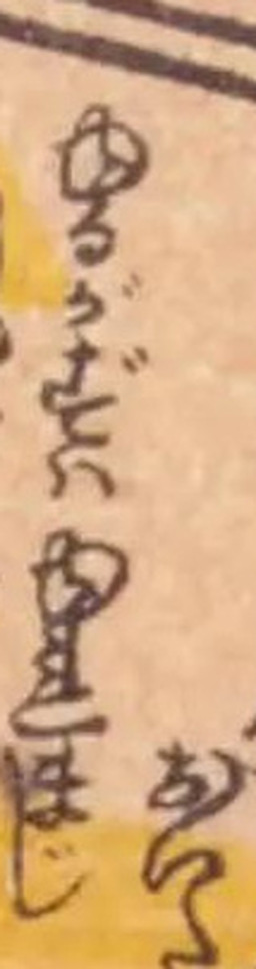ゆるがずはぬれまじ
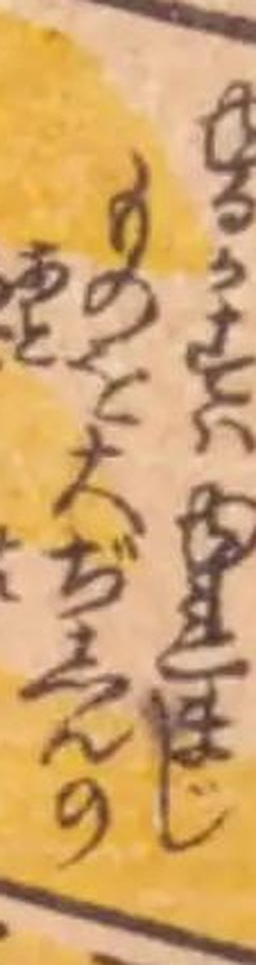ものを大ぢしんの
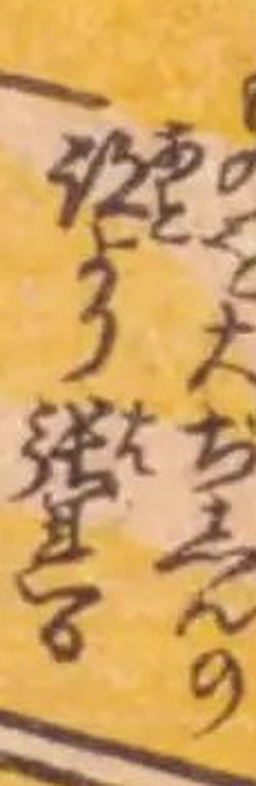跡より張れる
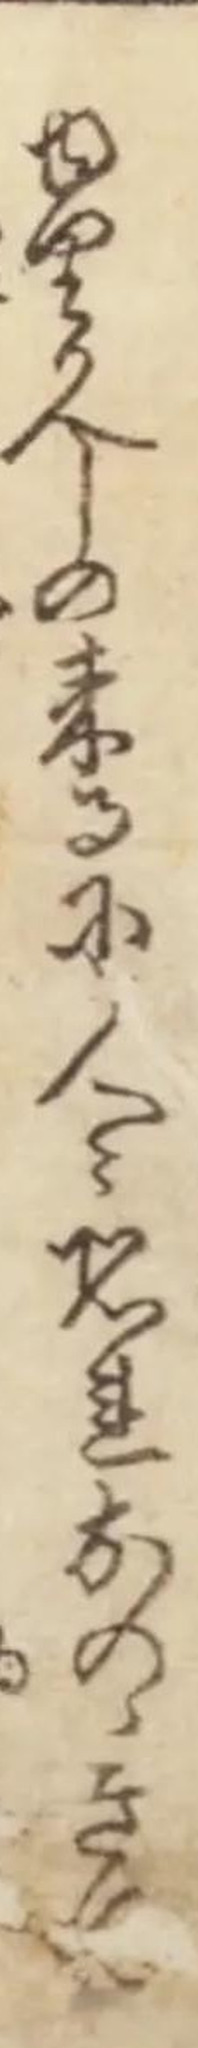ゆりかへしの来るに人々恐れおのゝきて
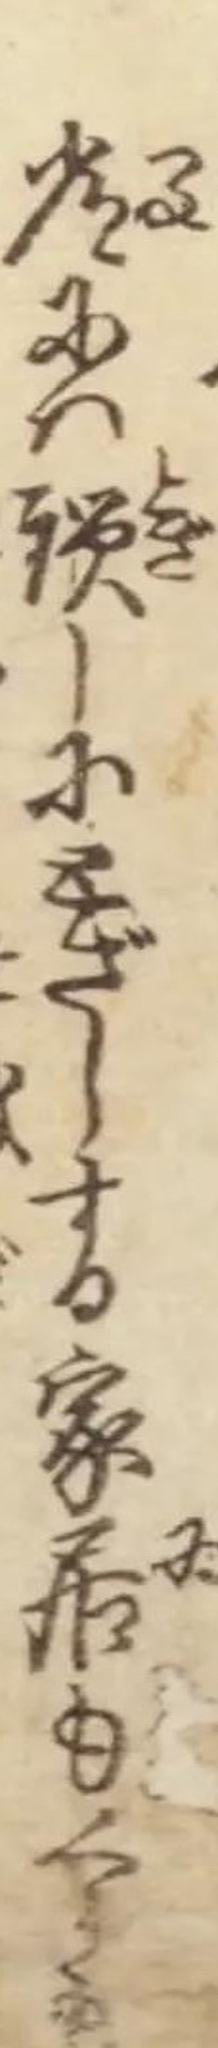常には鎖しにとざしする家居もくらくもの
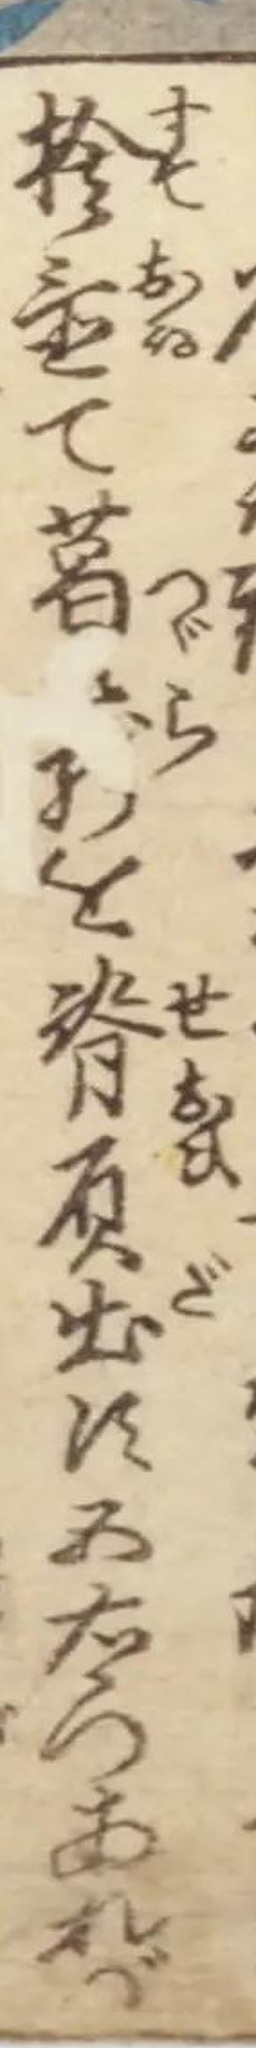捨置て葛籠を背負出す五右衛門あれば
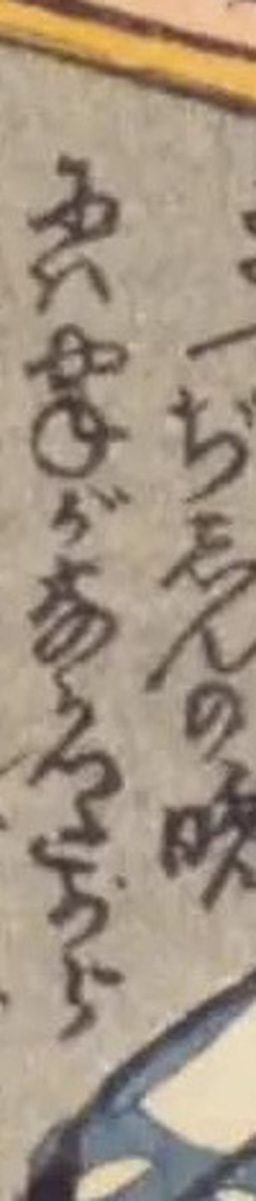にはやねがなかつたから
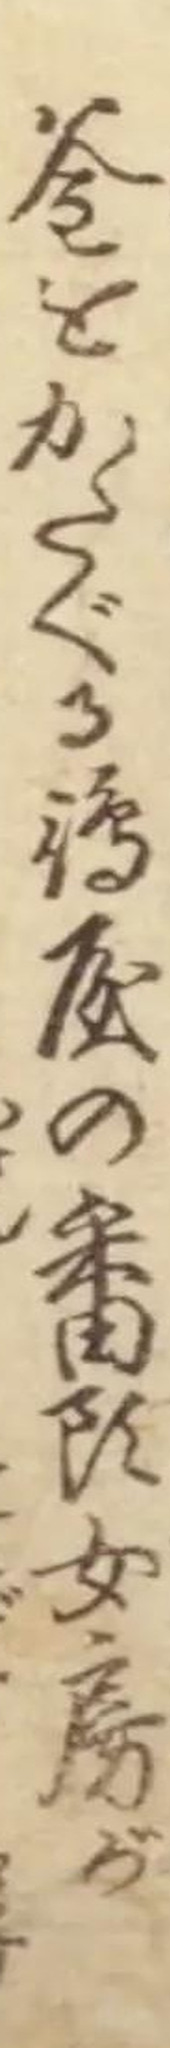釜をかたぐる嶋屋の番頭女房が
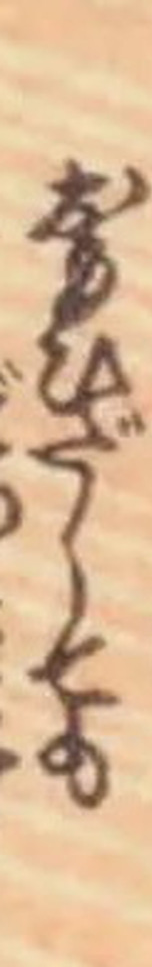おもひだしても
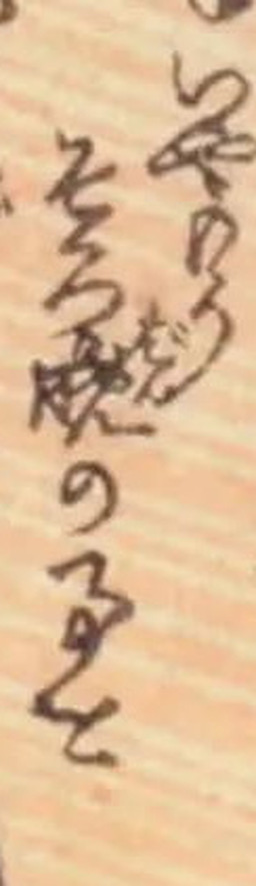そろ晩の事を
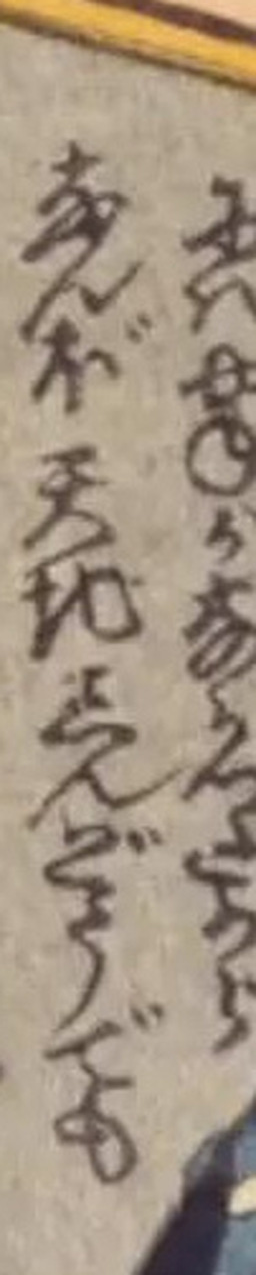なんぼ天地しんどうでも
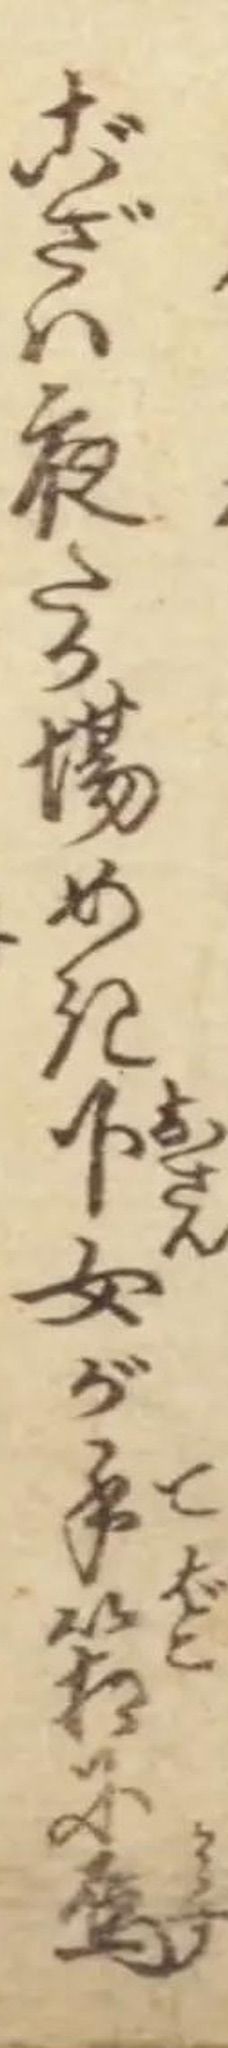ござは夜たか場如き下女が手箱に烏
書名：地震後野宿の図
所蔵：国立国会図書館 National Diet Library, JAPAN
